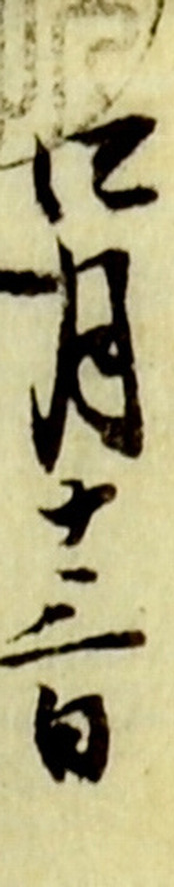四月十三日
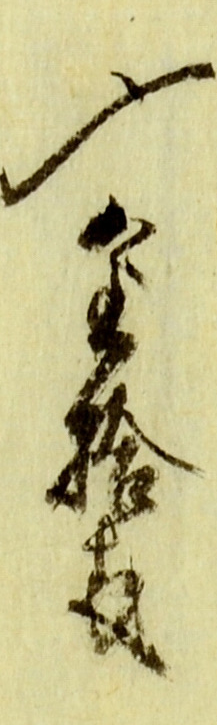〆金拾両

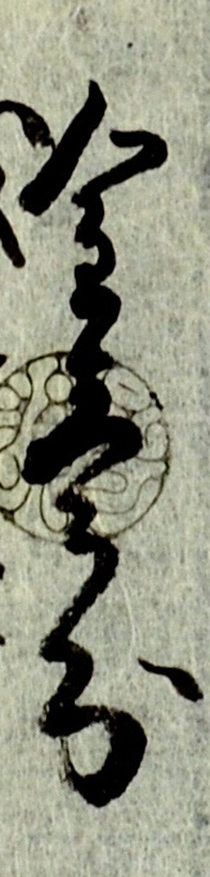金壱分
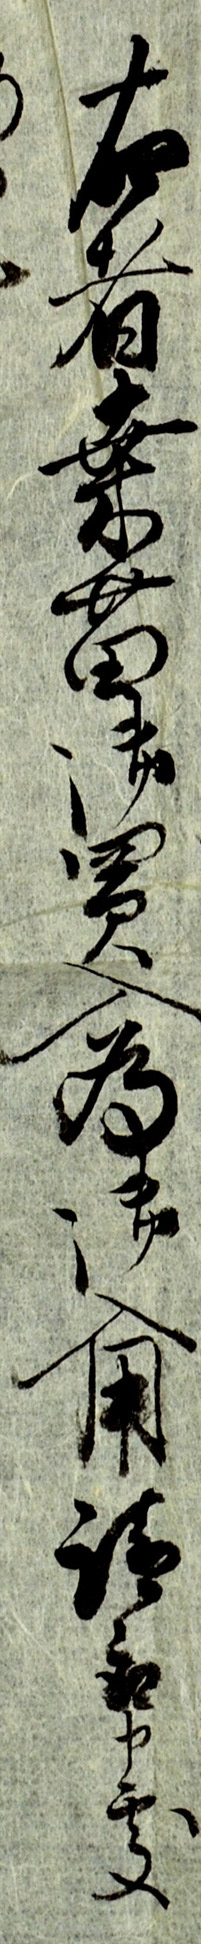右者桑苗御買入為御入用請取申処
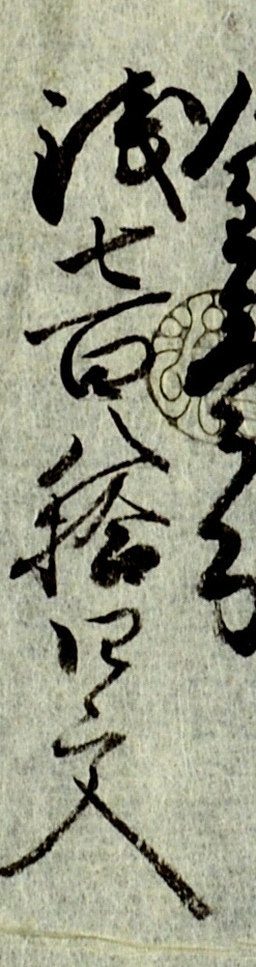銭七百八拾四文
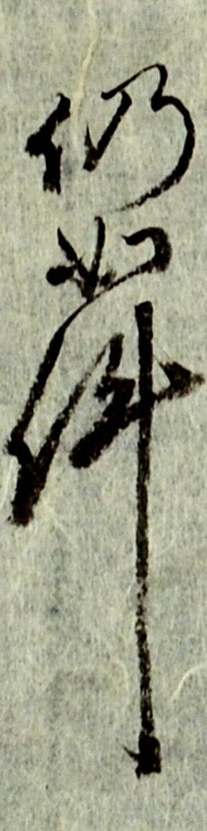仍如件
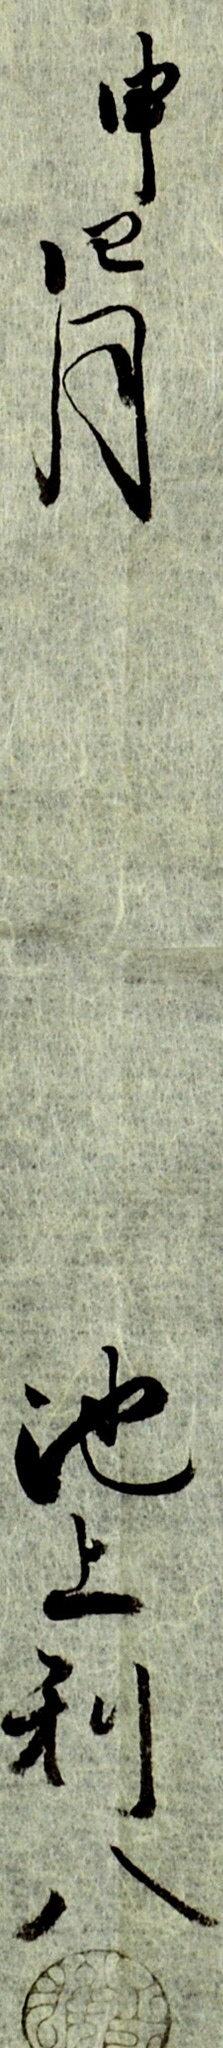申四月池上利八㊞
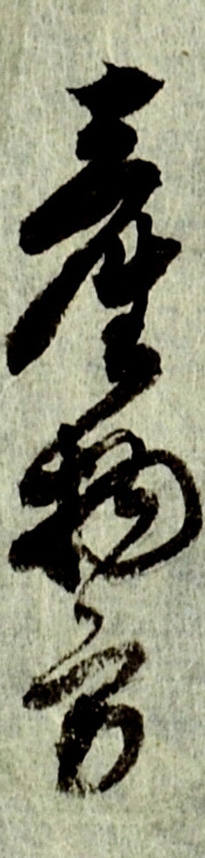産物方
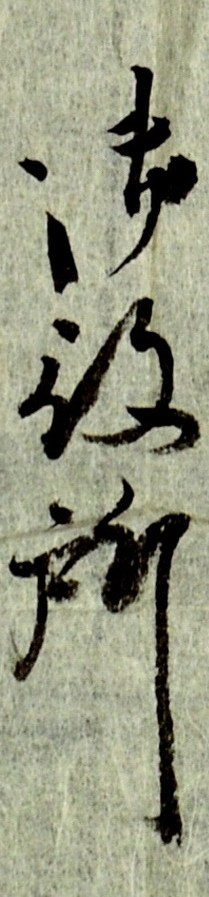御役所

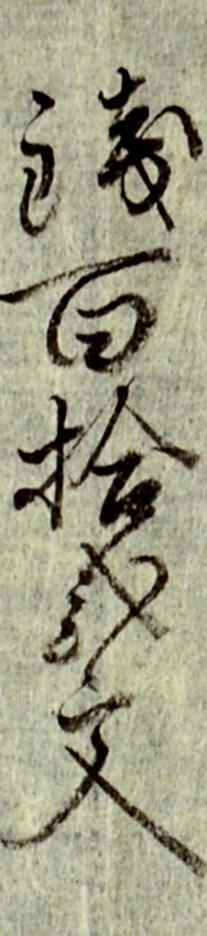銭百拾弐文
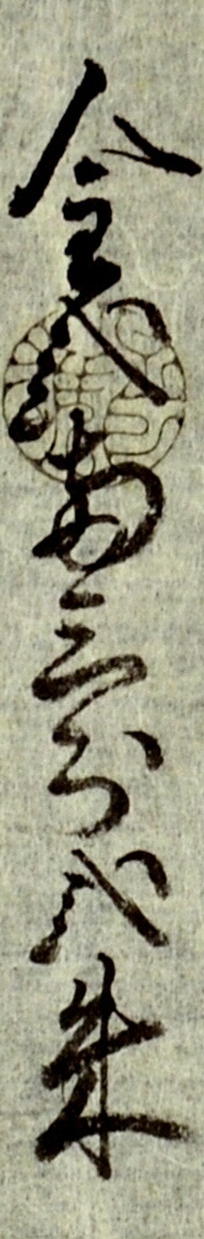金弐両三分弐朱
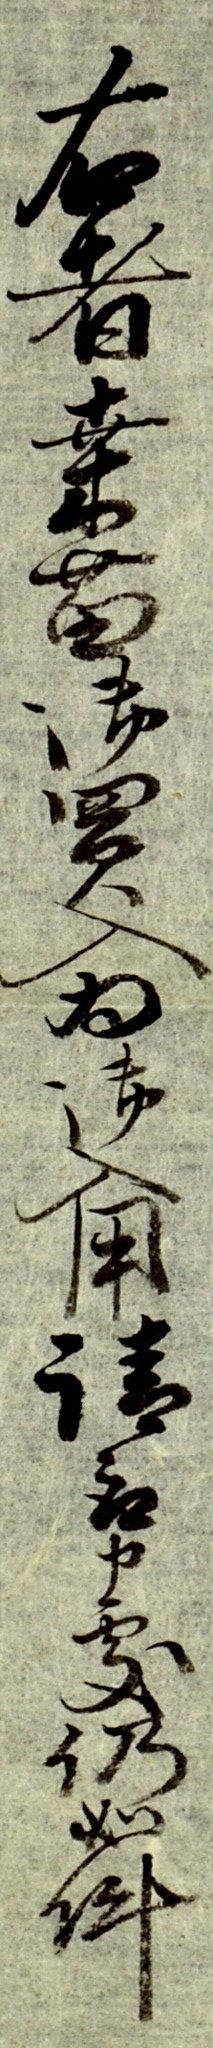右者桑苗御買入為御入用請取申処仍如件
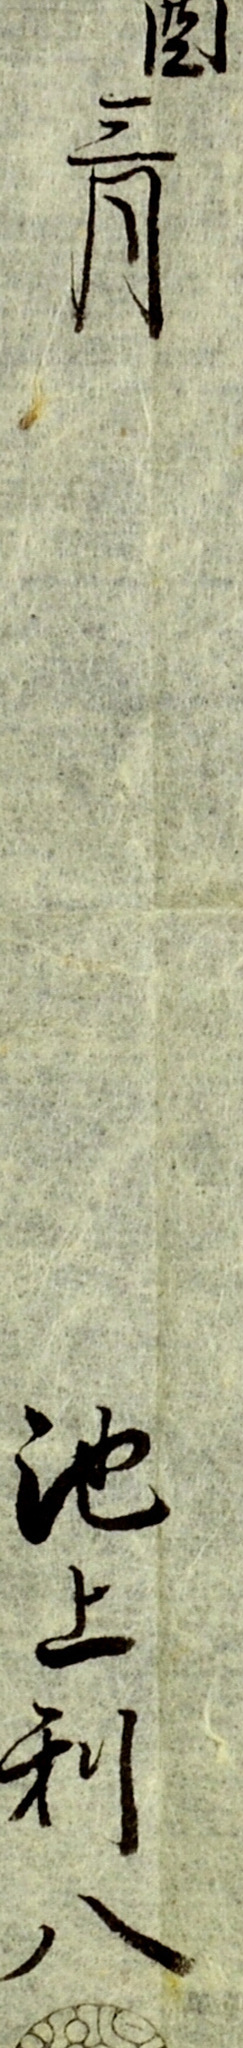酉三月池上利八㊞
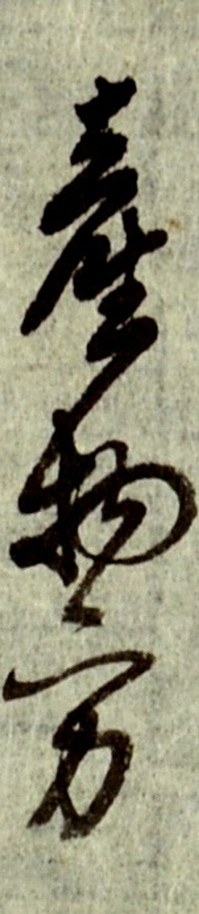産物方
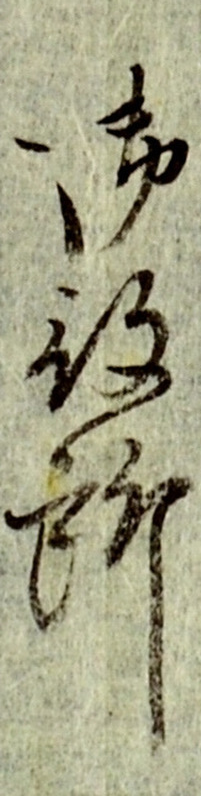御役所

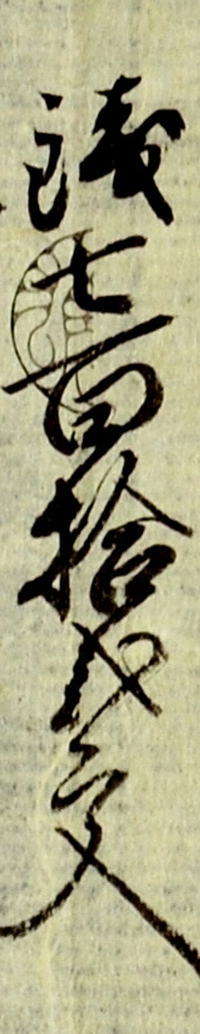銭七百拾弐文
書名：桑畑御入用金請取通
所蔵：伊那市立高遠町図書館・合同会社AMANE
